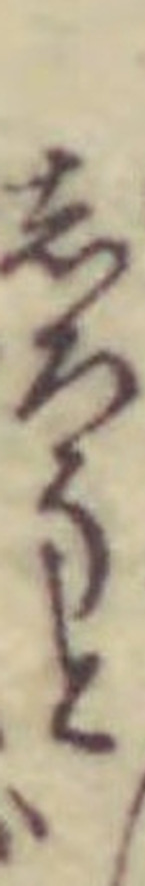しろうと
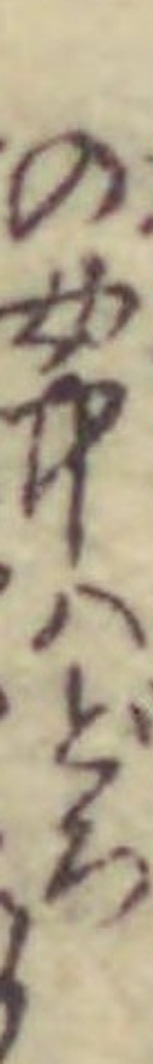の女中はどろ
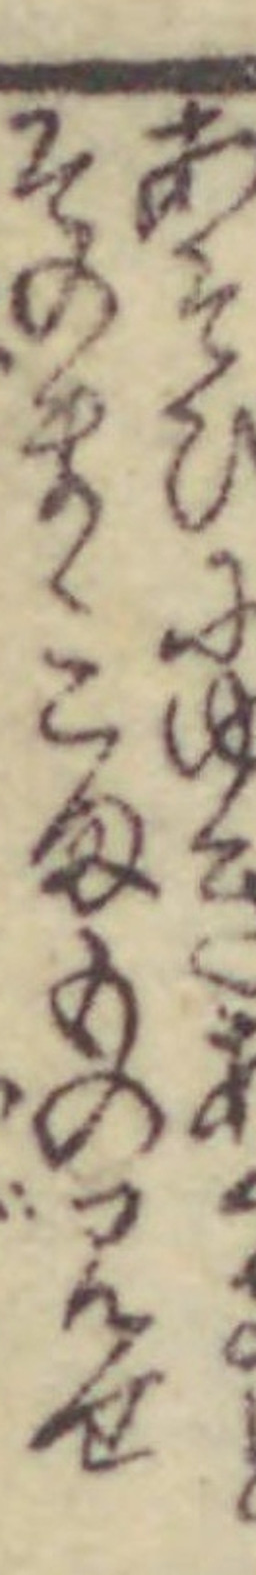そのまゝこまものみせ
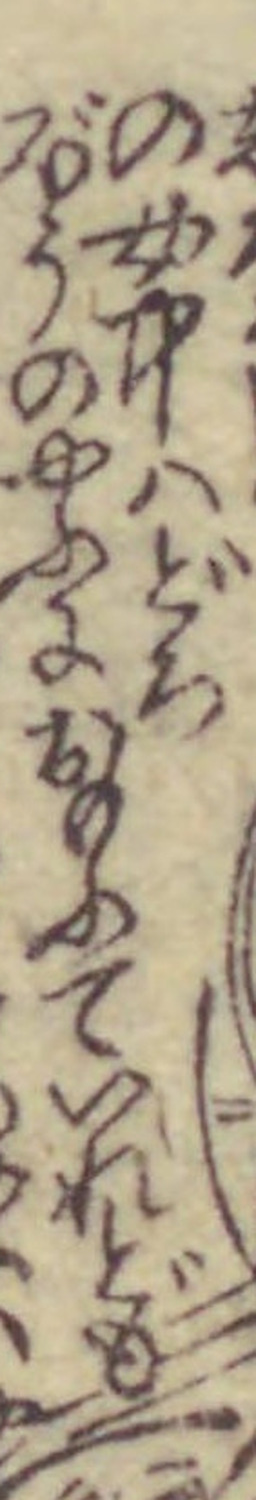ぼうのやふにおもふていれども
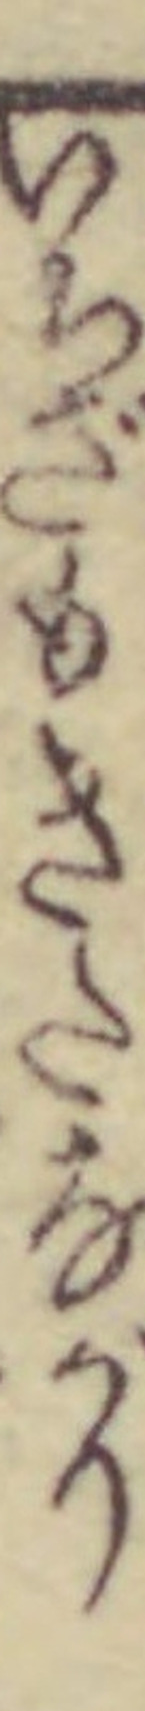いちざもきたながり
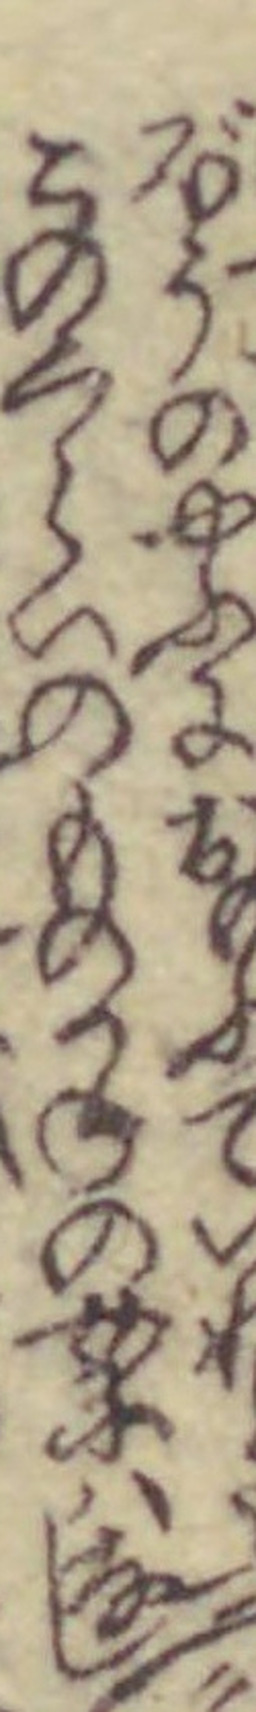このくらいのものかねの女にはなし
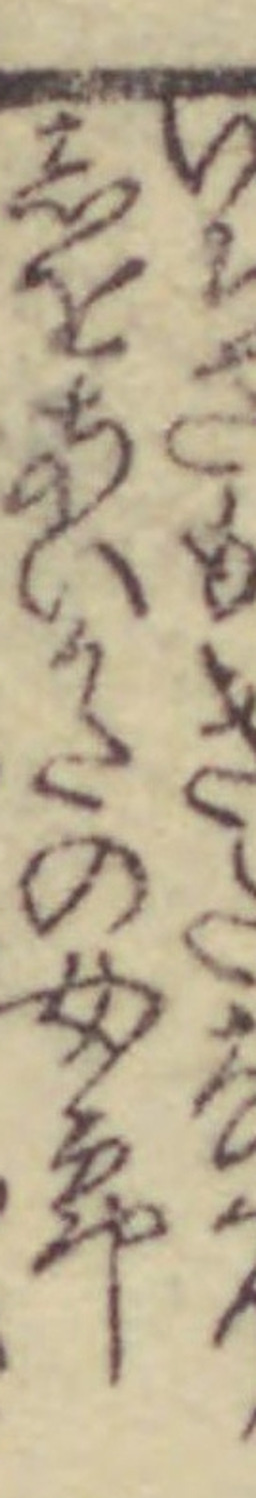しをあいかたの女郎
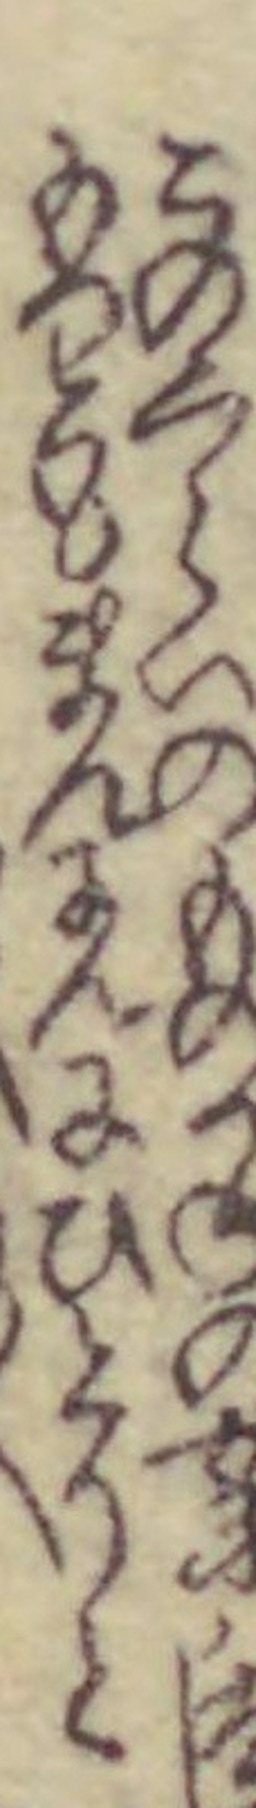もつともまんにんにひとりと
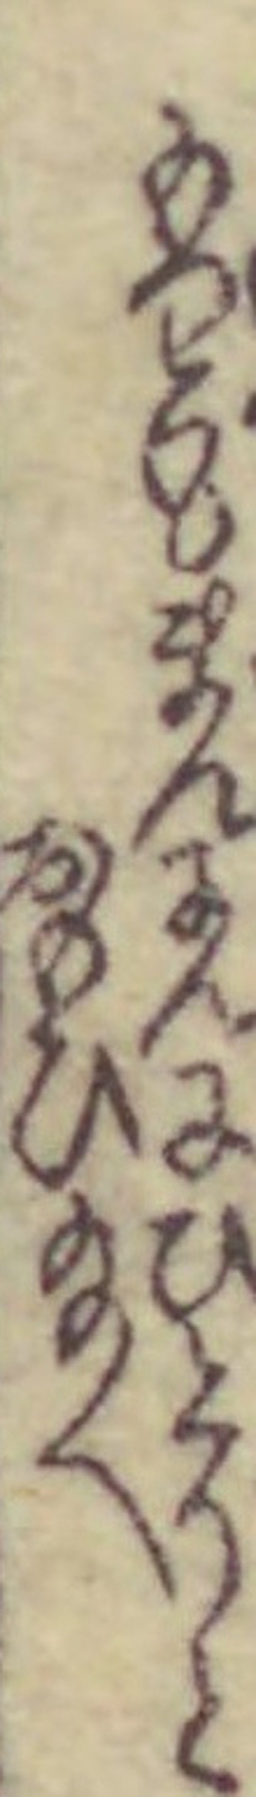おもひ給へ
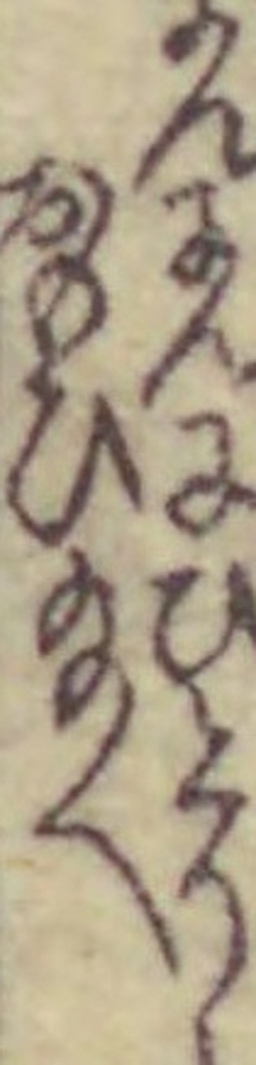おもひ給へ
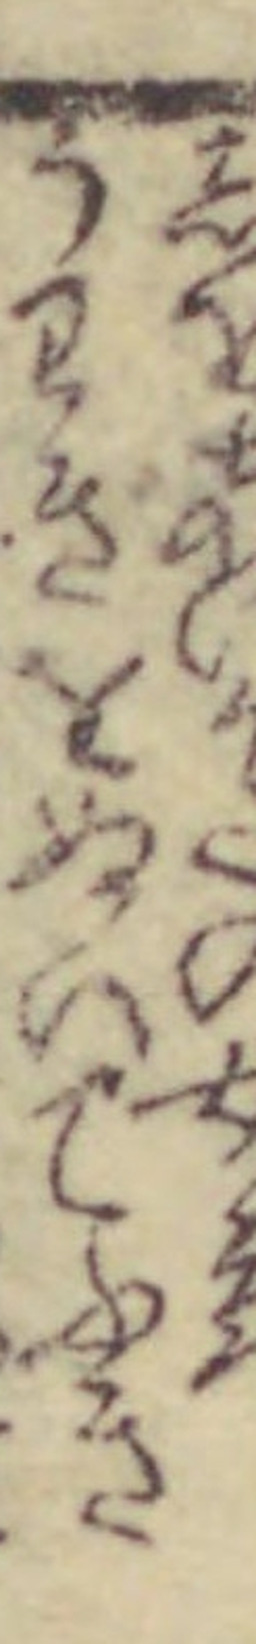うわぎをぬいてふき
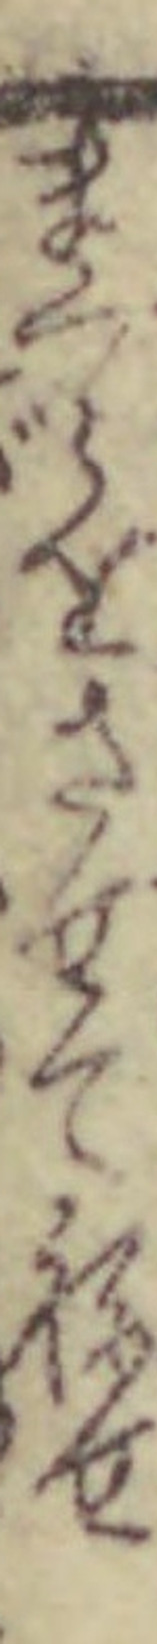まくらをさせてねせ
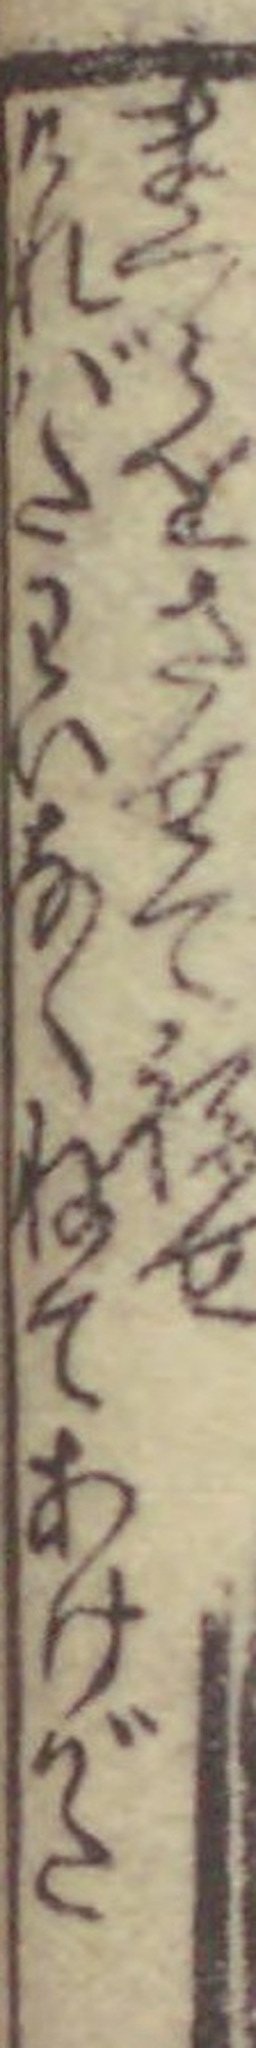ければたわいなくねてあけがた
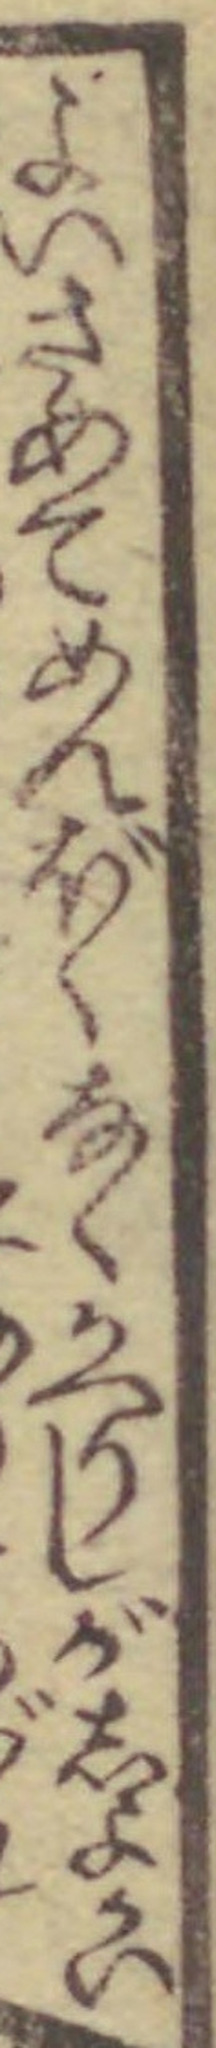よいさめてめんぼくなくかへりしがしよかい
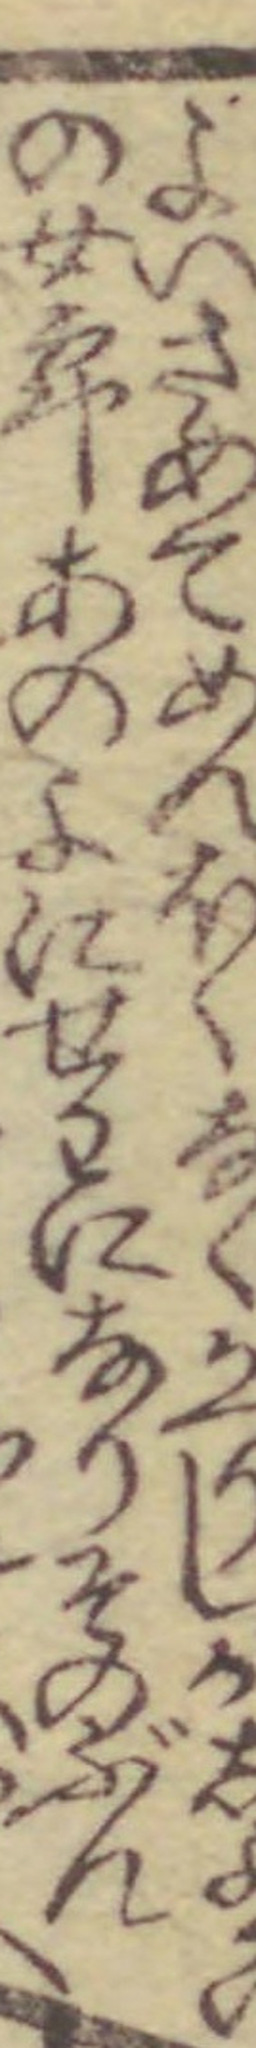の女郎あのよにせわになりそのぶん
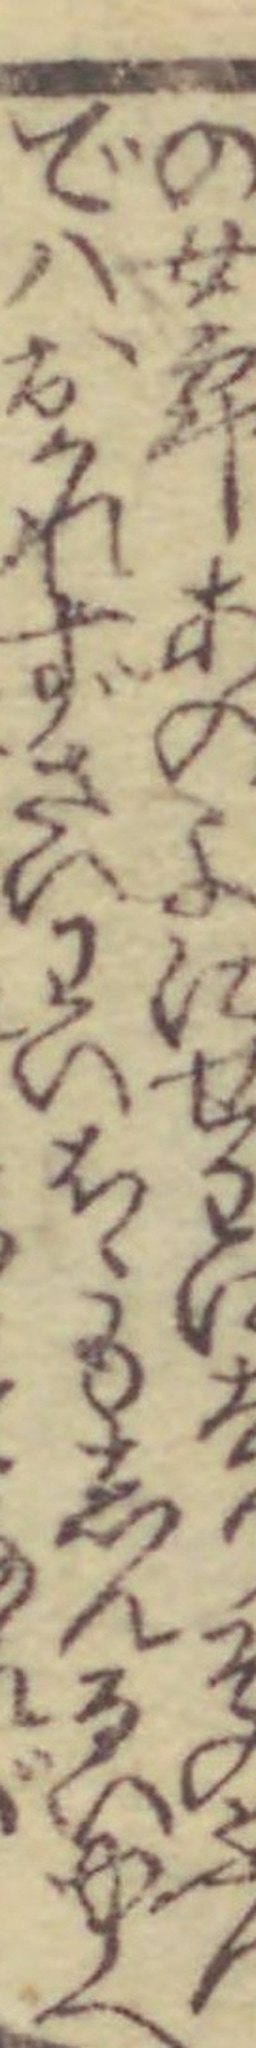ではおかれずさいわいはゝもしんるい中へ
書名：大通人穴[サガシ] 3巻
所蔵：国立国会図書館 National Diet Library, JAPAN
